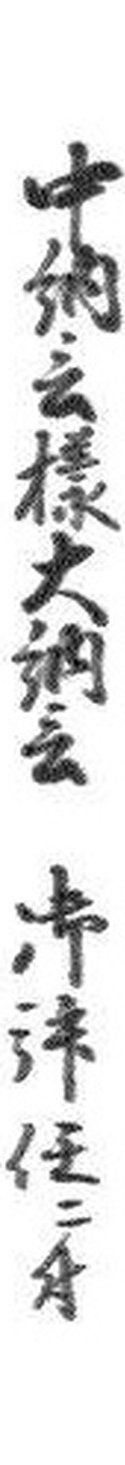中納言様大納言御拝任ニ付

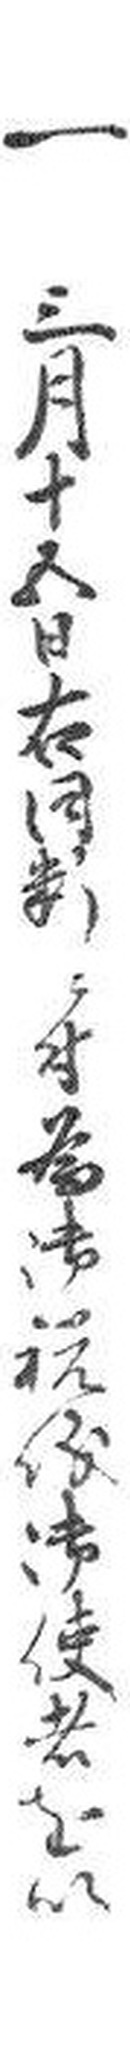一三月十五日右同断ニ付為御祝儀御使者を以
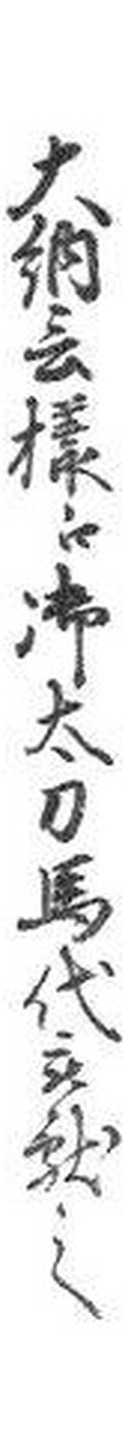大納言様江御太刀馬代被献之
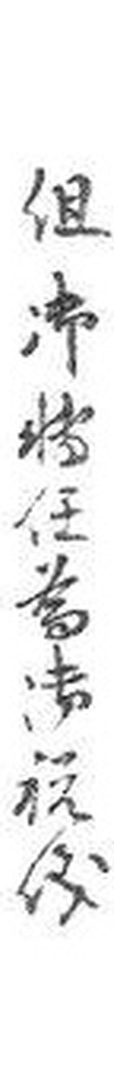但御転任為御祝儀
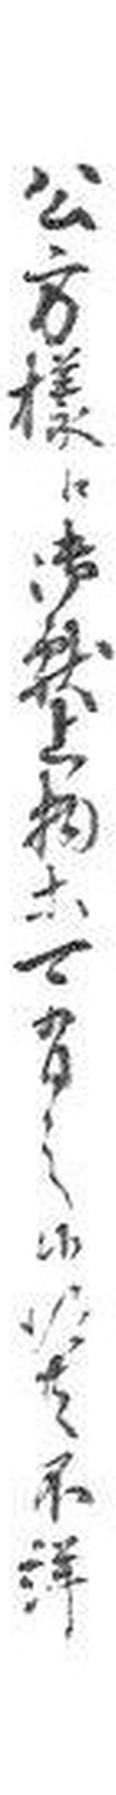公方様江御献上物等可有之候得共不詳
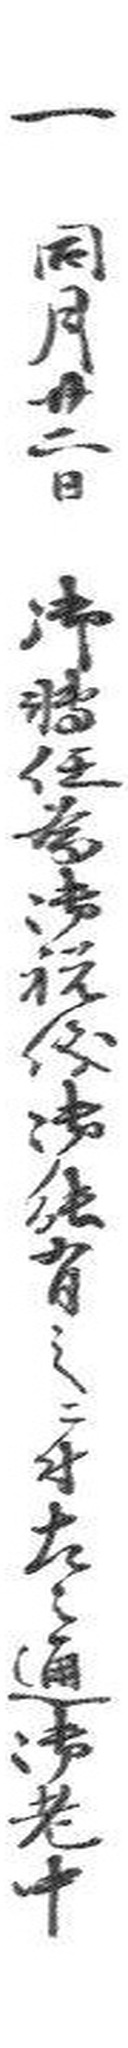一同月廿二日御転任為御祝儀御能有之ニ付左之通御老中
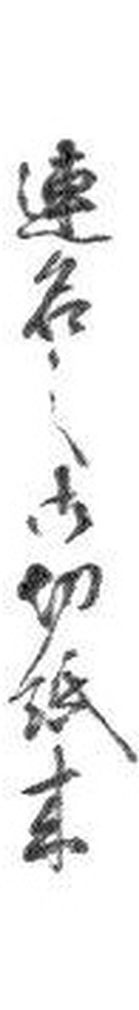連名之御切紙来
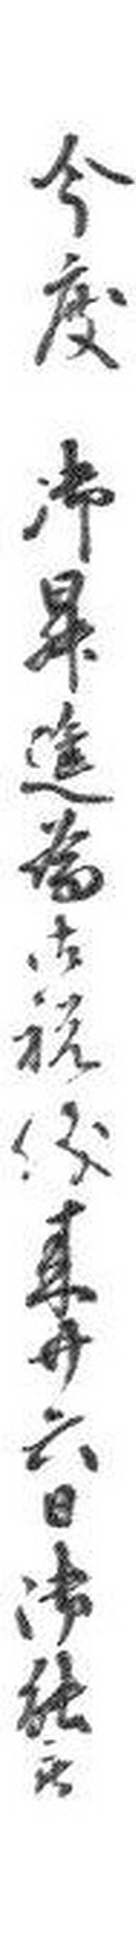今度御昇進為御祝儀来廿六日御能被
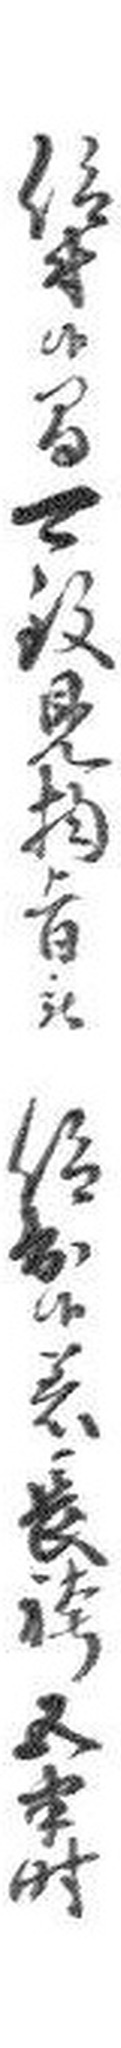仰付候間可致見物旨被仰出候着長袴五半時
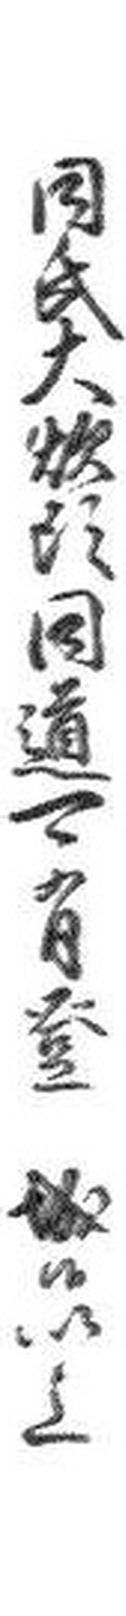同氏大炊頭同道可有登城候以上
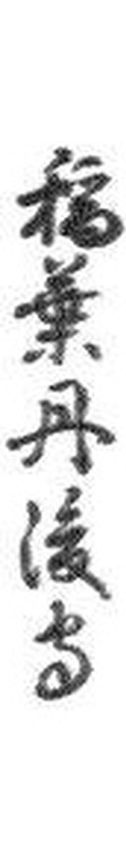稲葉丹後守
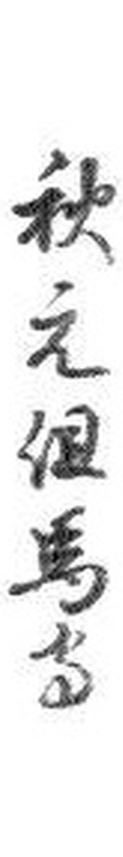秋元但馬守
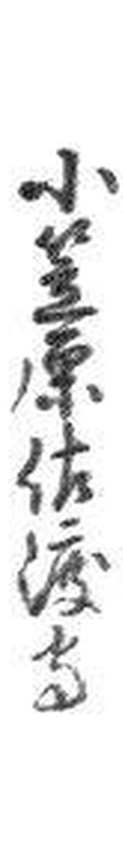小笠原佐渡守
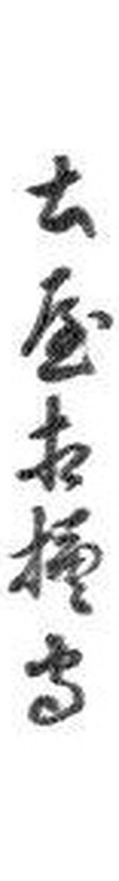土屋相模守
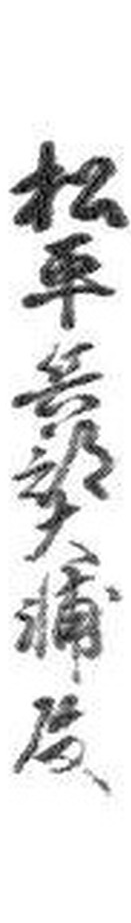松平兵部大輔殿
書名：家譜 二十三 吉品公 従宝永元年到同二年
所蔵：福井県文書館 Fukui Prefectural Archives
